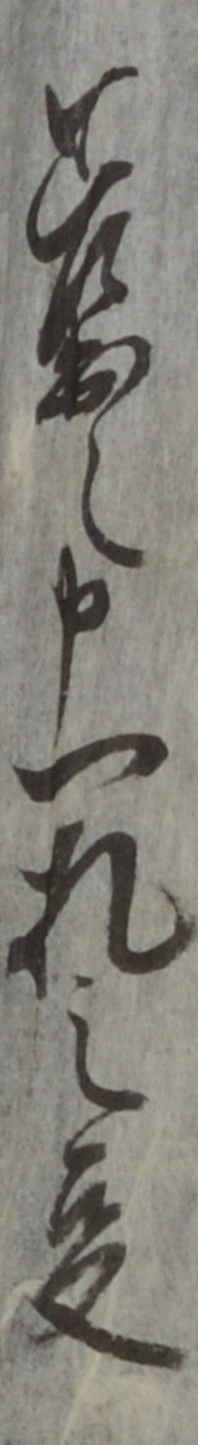差出し申一札之事
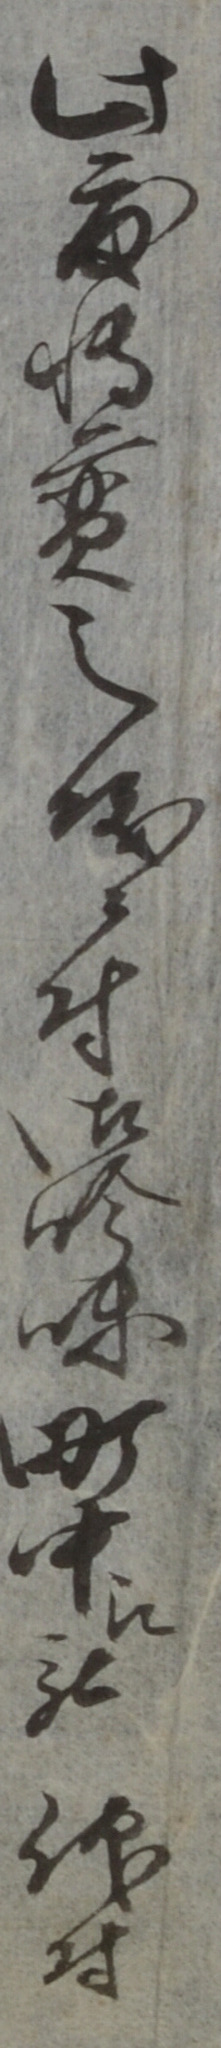此度博奕之儀ニ付御吟味町中江被仰付
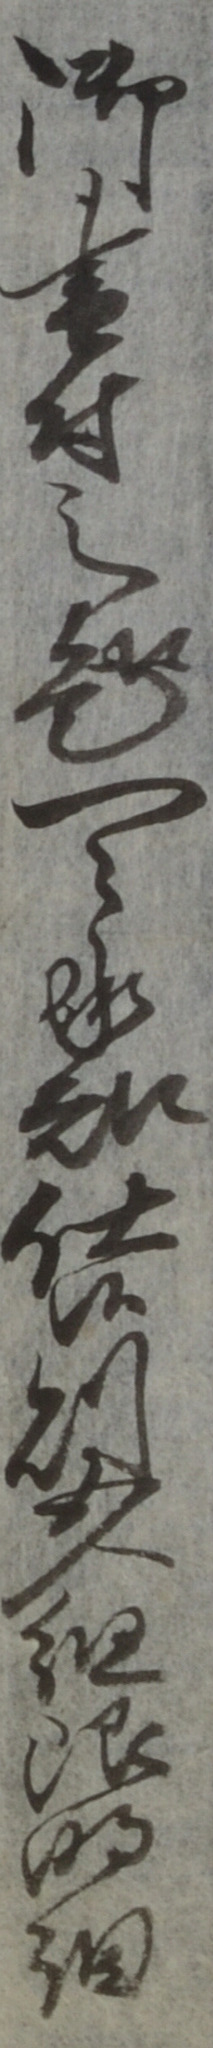御書付之趣一々承知仕候則五人組限明細
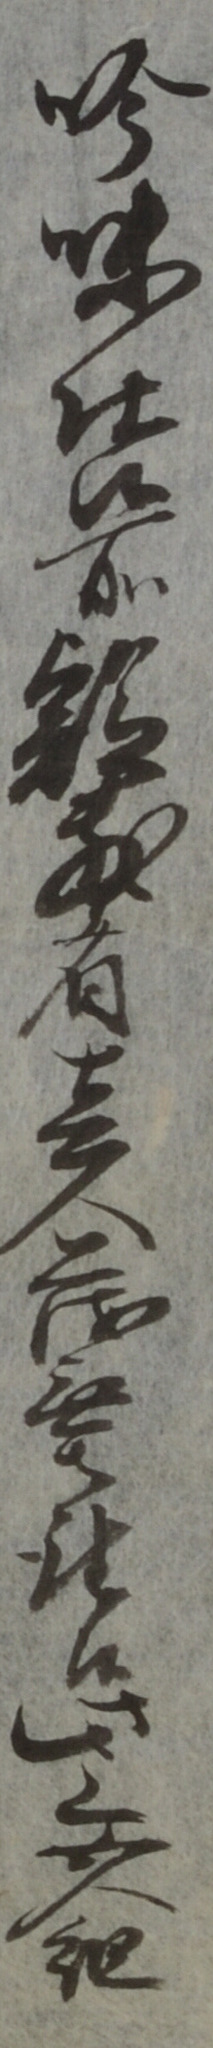吟味仕候所疑敷者壱人も無御座候此上五人組
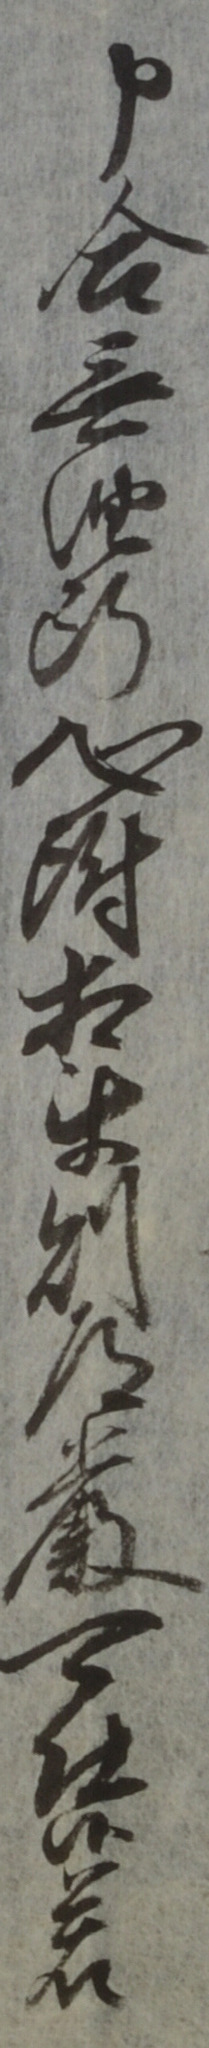申合無油断心附相互則道厳可仕候若
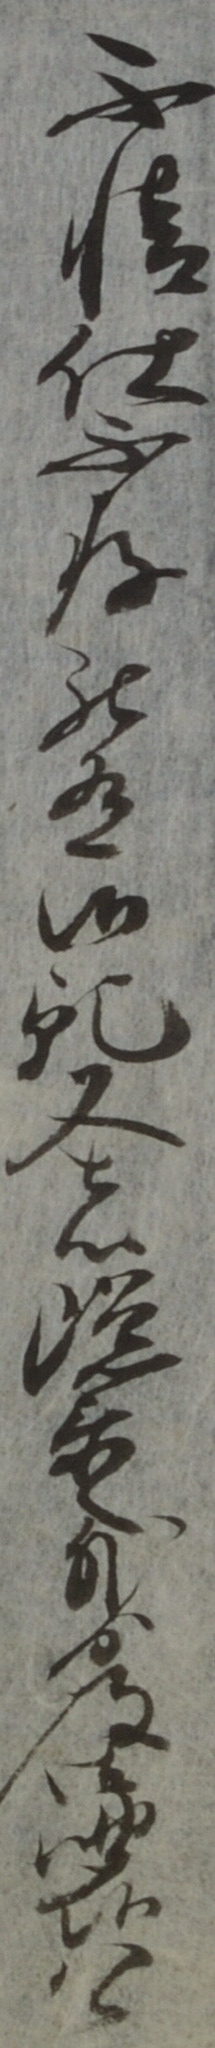不情仕不存罷有候歟又は隠置外ゟ及御聞候ハヽ
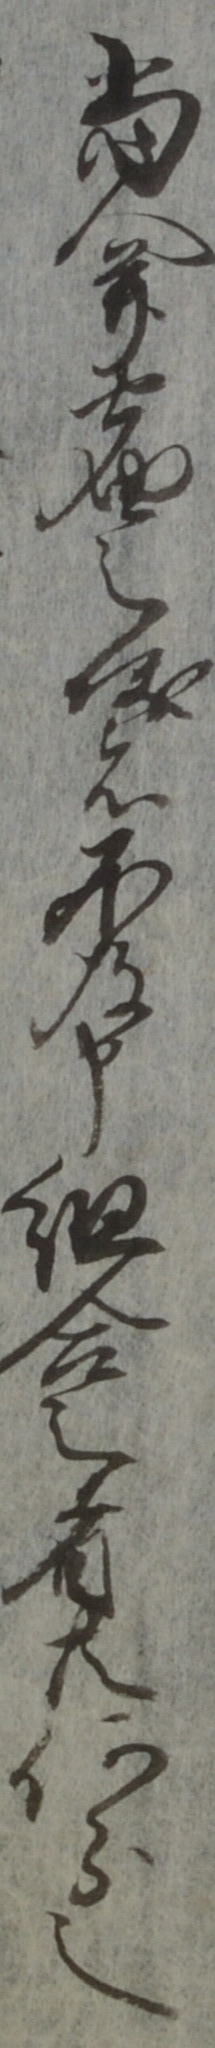当人并宿之儀は不及申組合之者共何分之
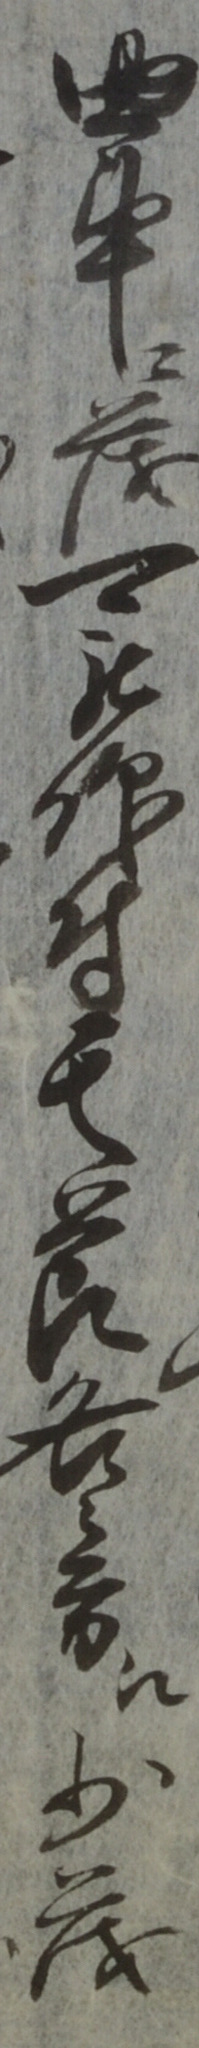曲事ニも可被仰付其節各々方江少も
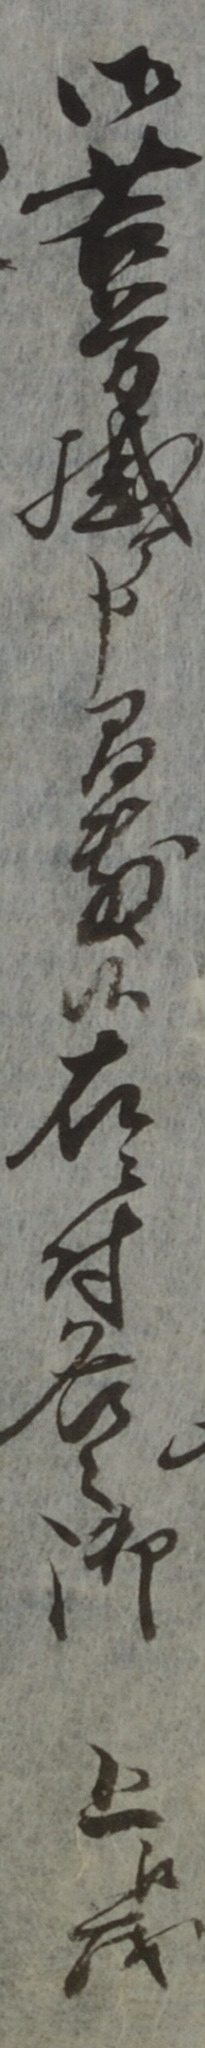御苦労掛ケ申間敷候右ニ付各々御上江も
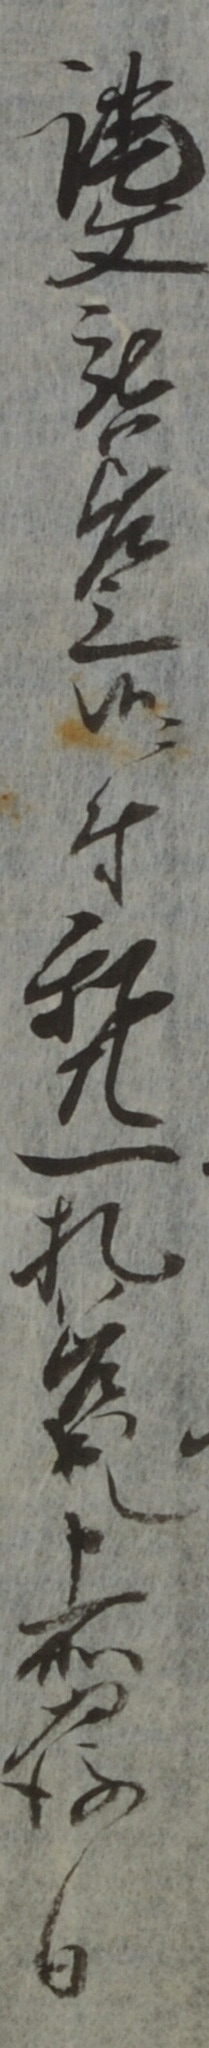証文被差上候ニ付私共一札差出し申所為後日
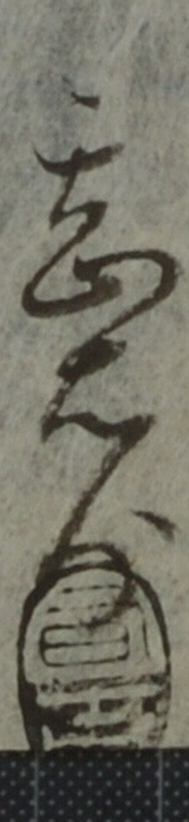甚右衛門㊞
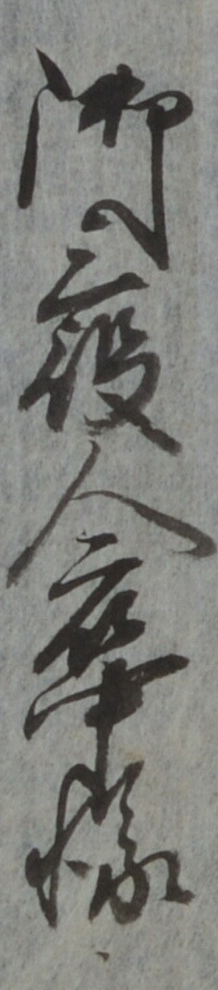御三役人衆中様
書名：差出し申一札之事
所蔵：伊那市立高遠町図書館・合同会社AMANE
